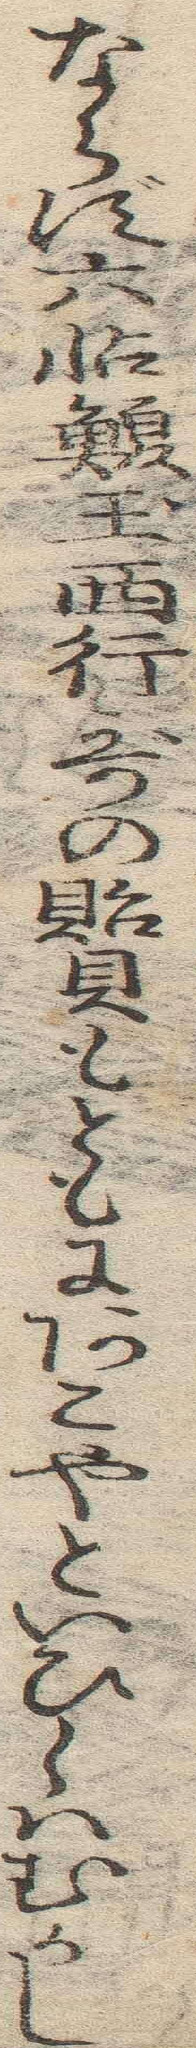ならず六帖鰒玉西行哥の貽貝もともにあこやといひしはむかし
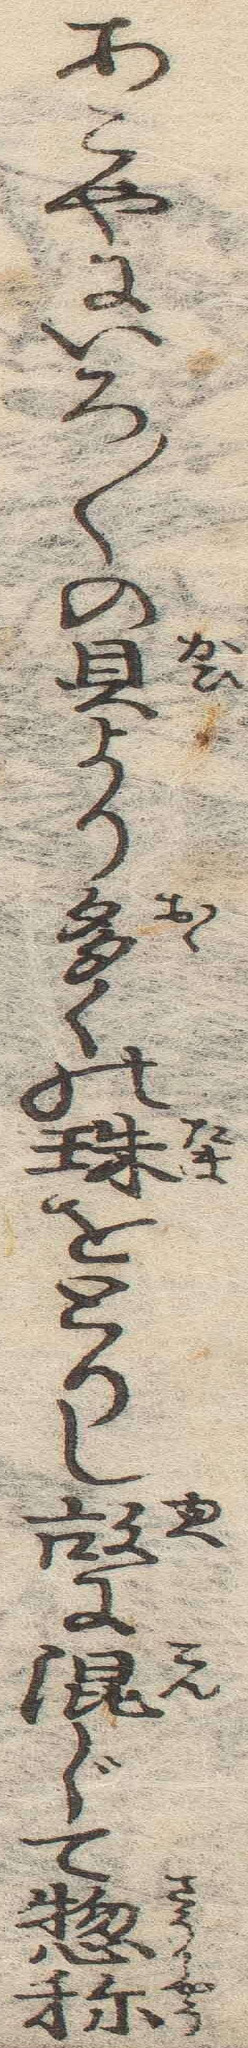あこやにいろ〳〵の貝より多くの珠をとりし故に混じて総称
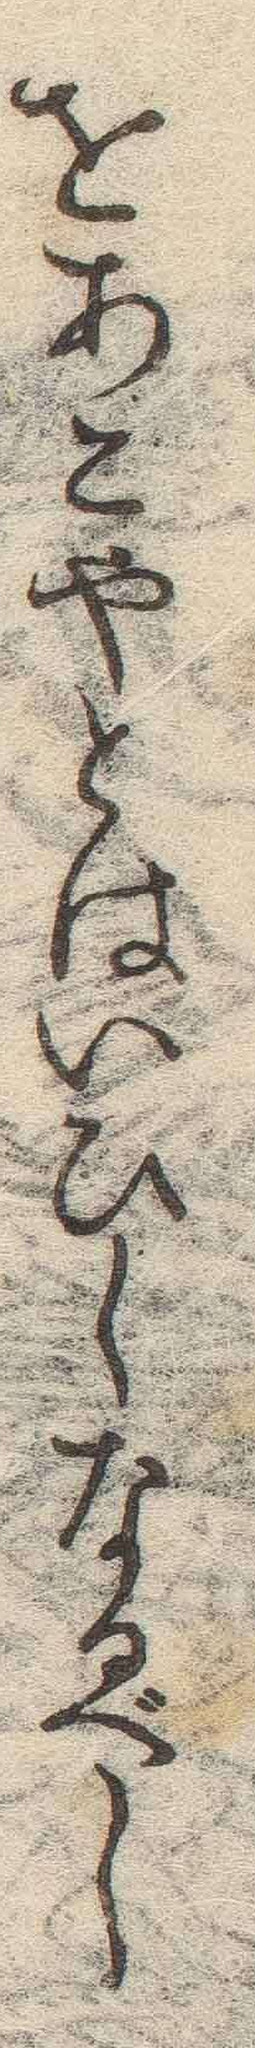をあこやとはいひしなるべし
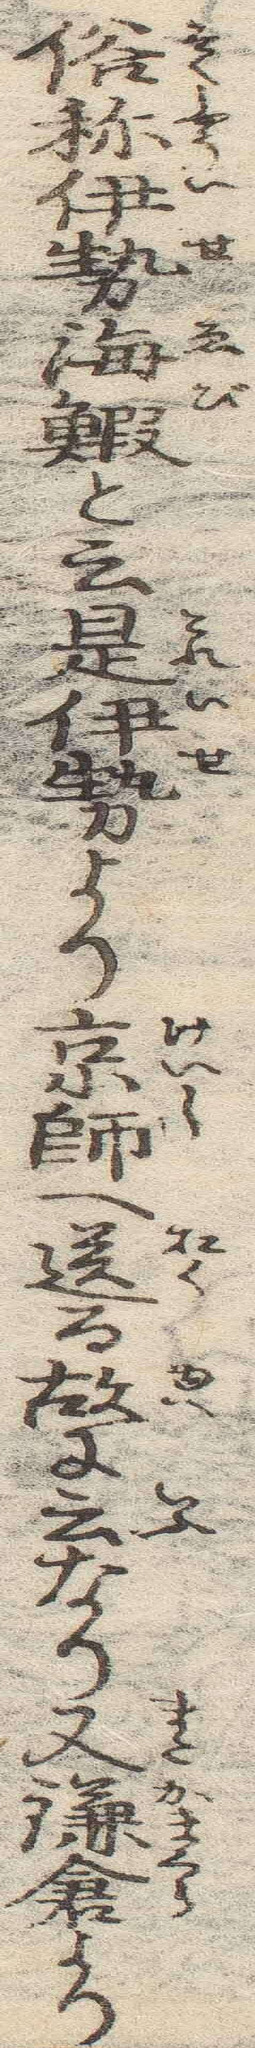俗称伊勢海鰕と云是伊勢より京師へ送る故に云なり又鎌倉より
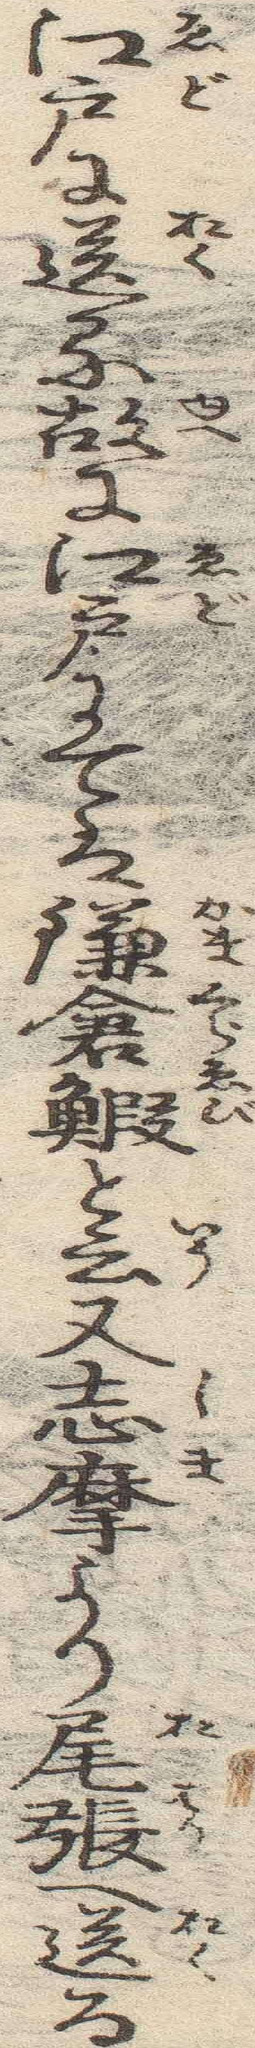江戸に送る故に江戸にては鎌倉鰕と云又志摩より尾張へ送る
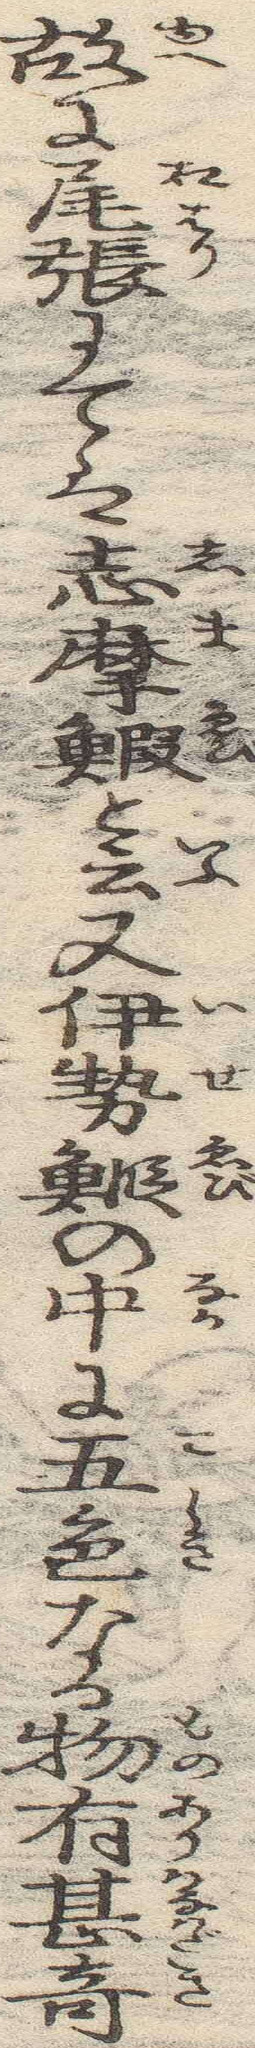故に尾張にては志摩鰕と云又伊勢鰕の中に五色なる物有甚奇
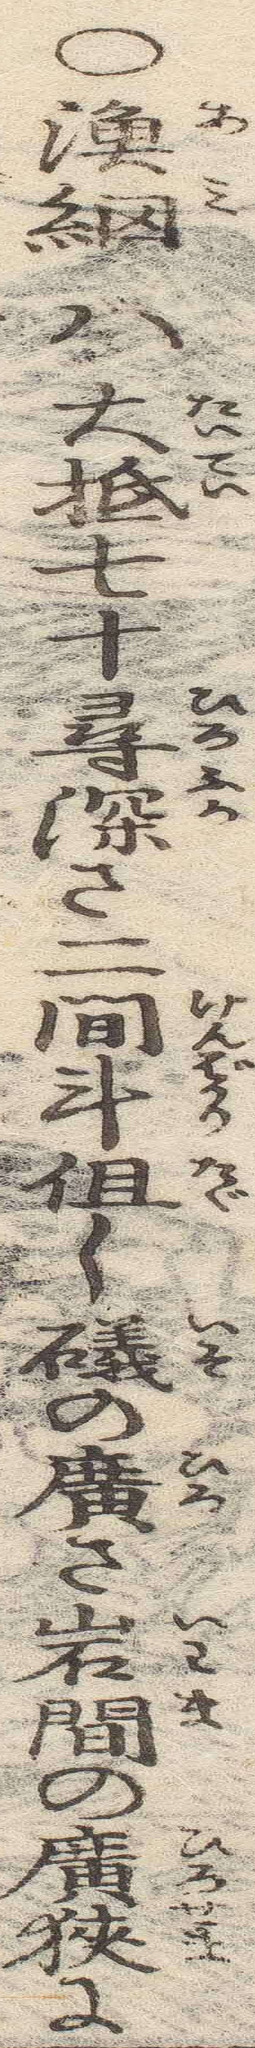○漁網は大抵七十尋深さ二間斗但し礒の広さ岩間の広狭に
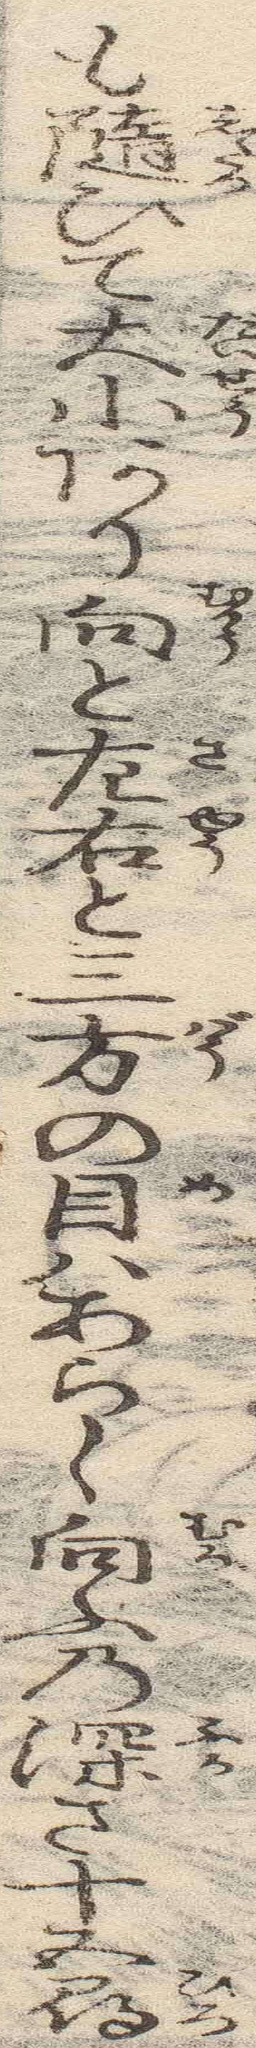も随ひて大小あり向と左右と三方の目はあらし向ふの深さ十五尋
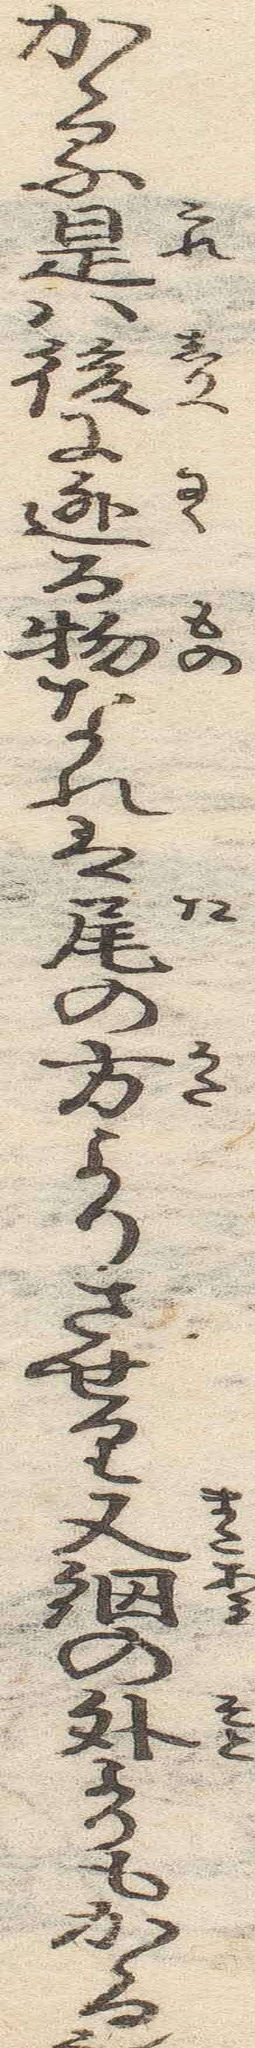かゝる是は後に逃る物なれは尾の方よりさせり又網の外よりもかゝる也
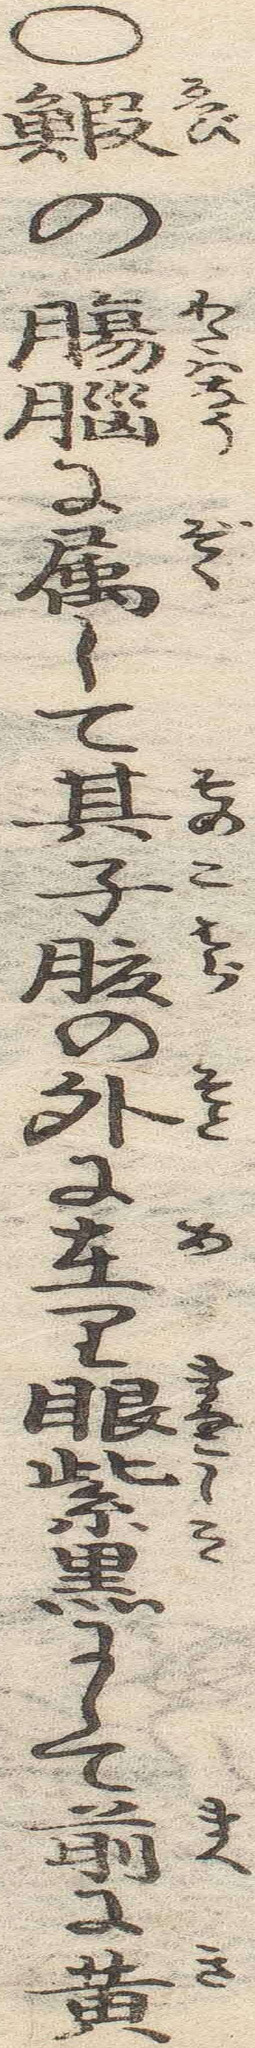○鰕の膓脳に属して其子腹の外に在り眼紫黒にして前に黄
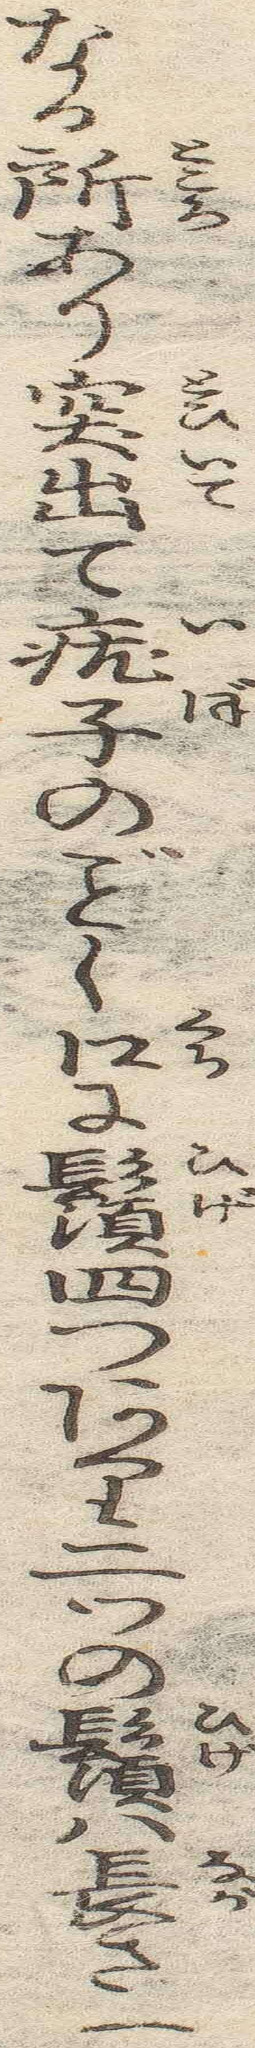なる所あり突出て疣子のごとし口に鬚四つあり二つの鬚は長さ一
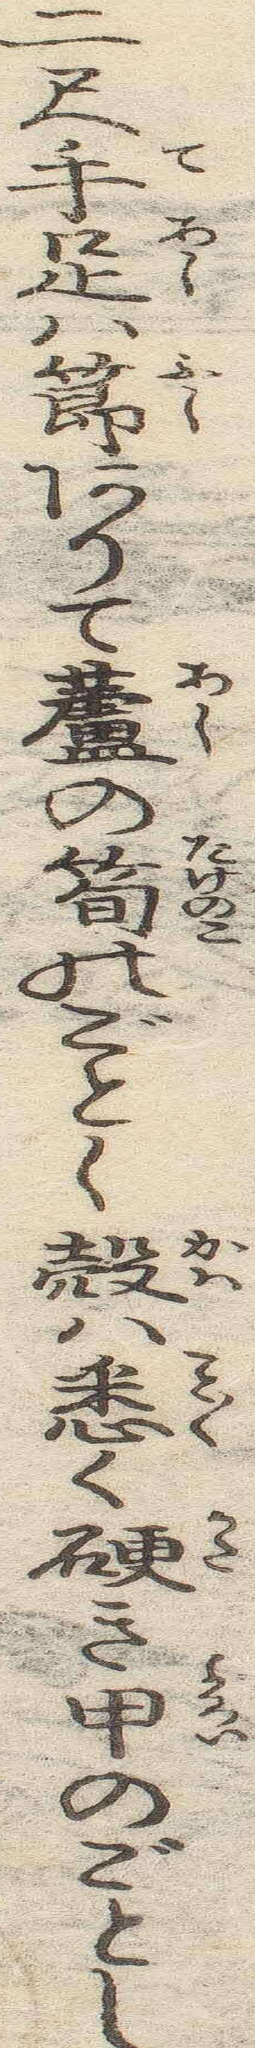二尺手足は節ありて蘆の筍のごとし殻は悉く硬き甲のごとし
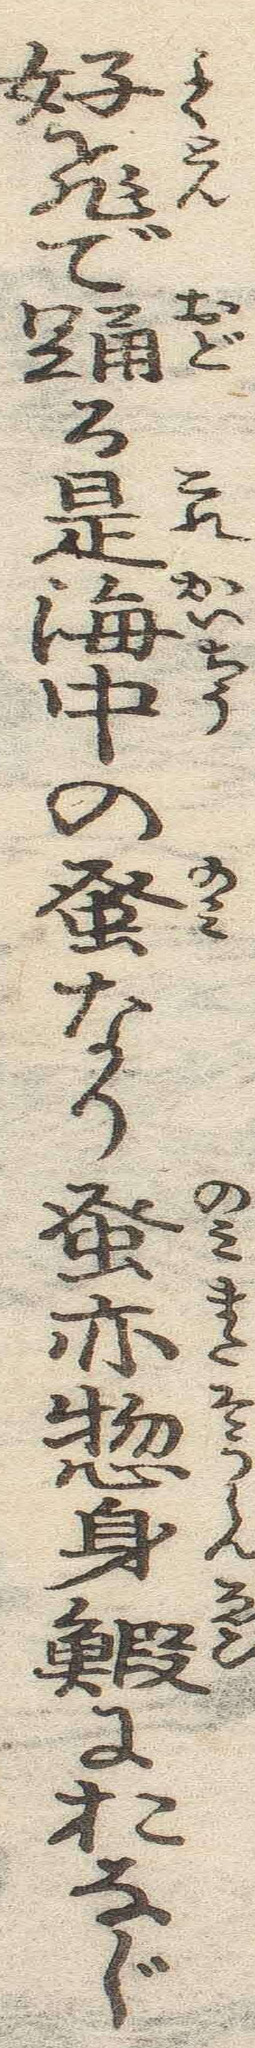好飛で踊る是海中の蚤なり蚤亦惣身鰕におなじ
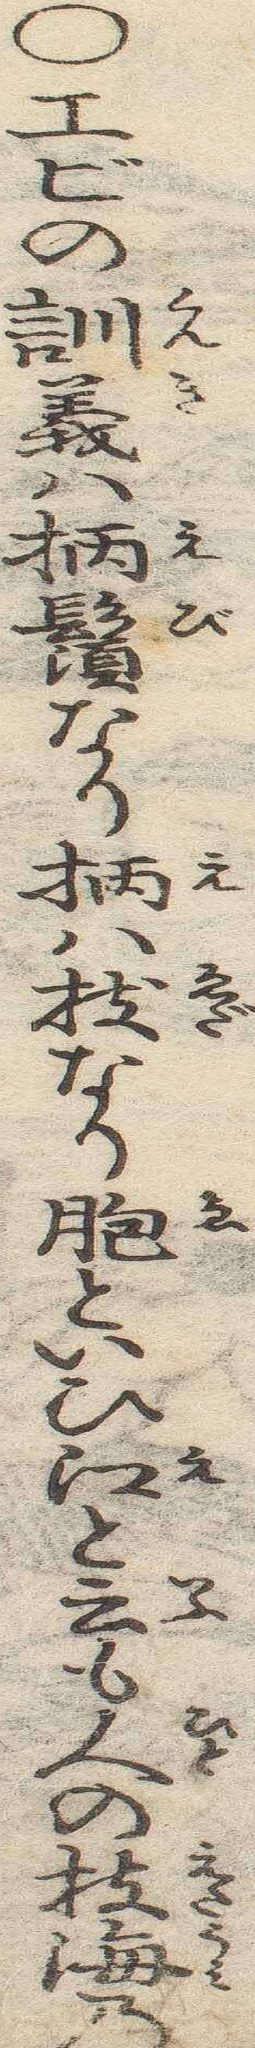○エビの訓義は柄鬚なり柄は枝なり胞といひ江と云も人の枝海の
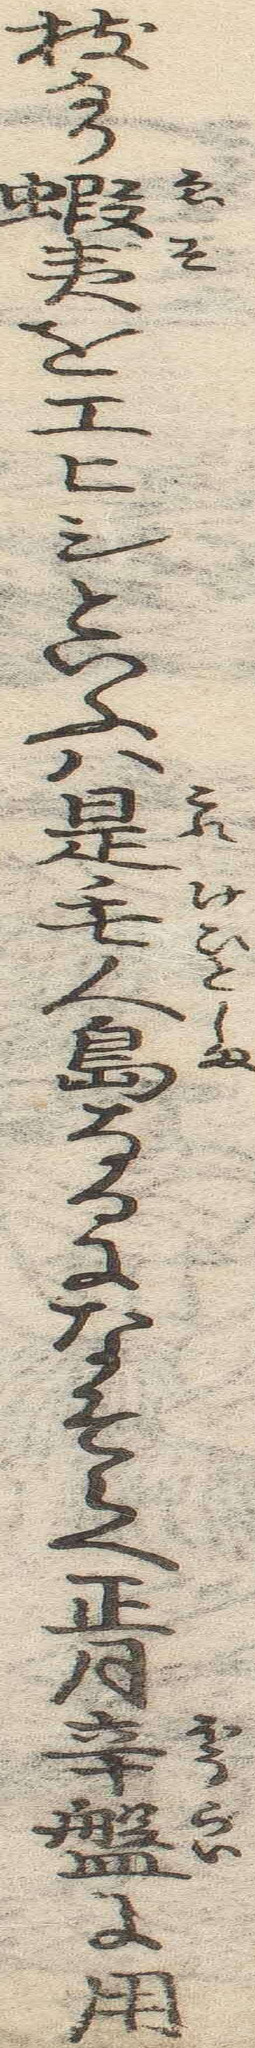枝なり蝦夷をエヒシといふは是毛人島なるになそらへ正月辛盤に用
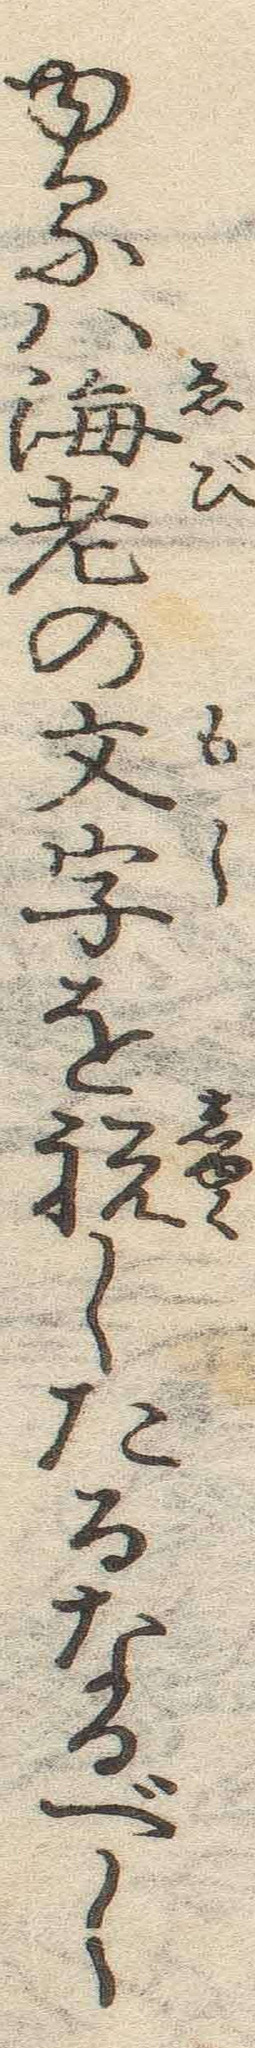ゆるは海老の文字を祝したるなるべし
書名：日本山海名産図会
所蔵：東京学芸大学附属図書館 国文学研究資料館
